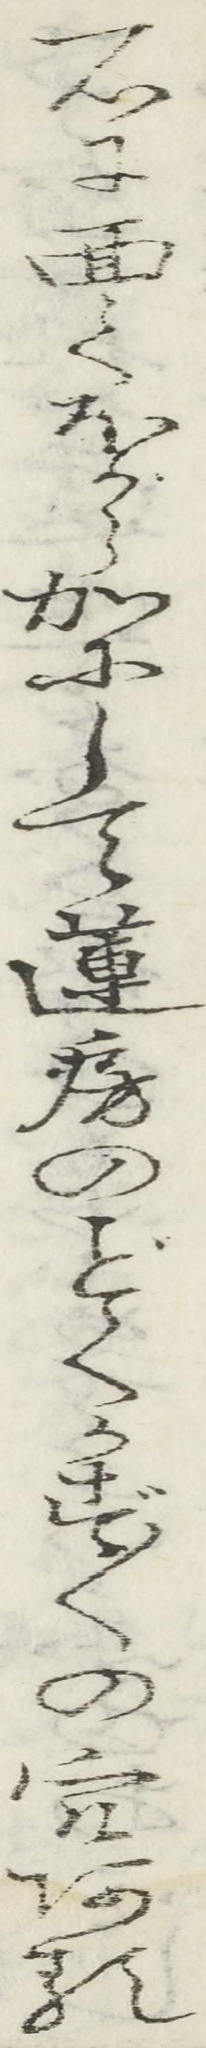石に面てほからかにして蓮房のことくかず〳〵の穴ある
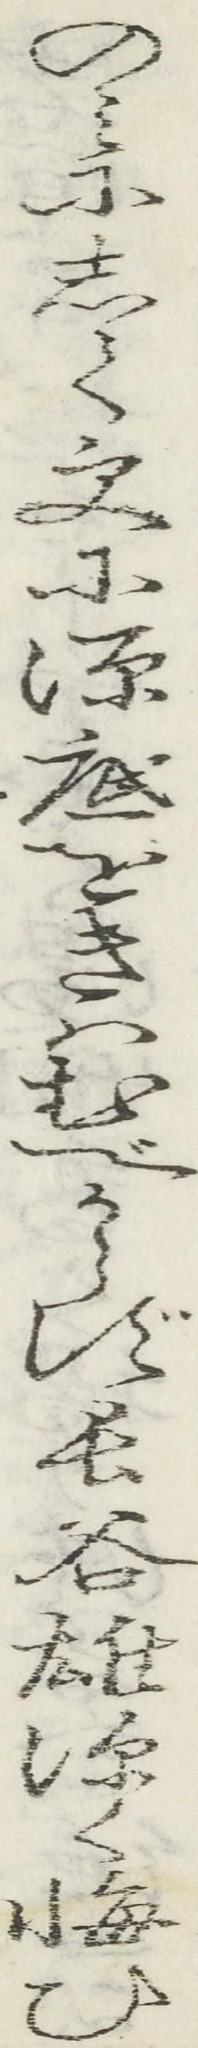のみにして更に源底をきはむべからず長谷雄深く悔ひ
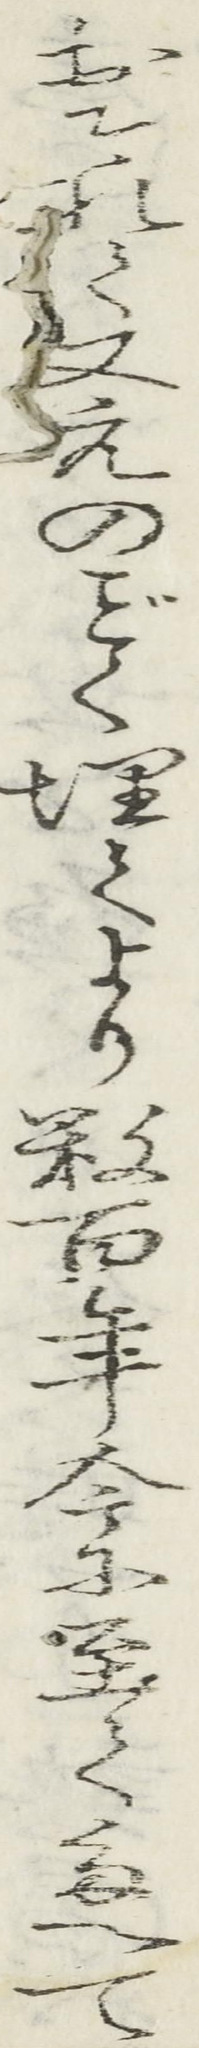おそれて又元のごとく埋てより数百年今に至てたへて
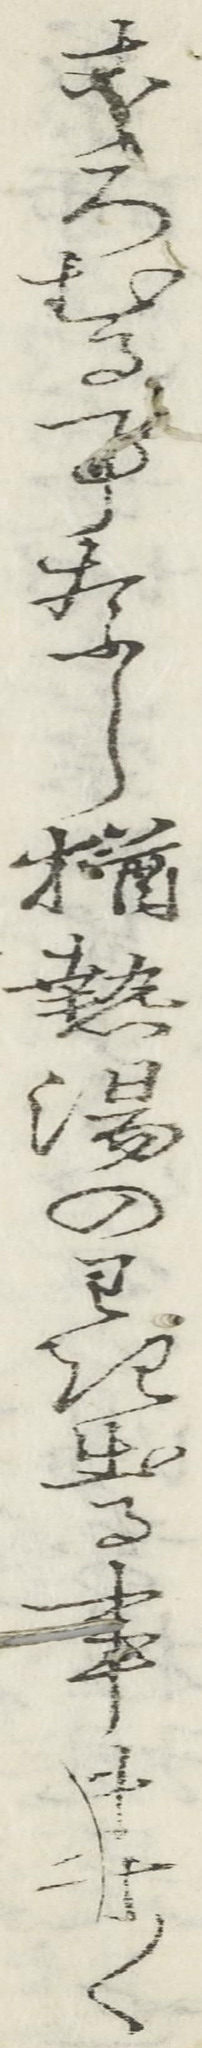こゝろむる事なし猶熱湯のわき出る事ます〳〵
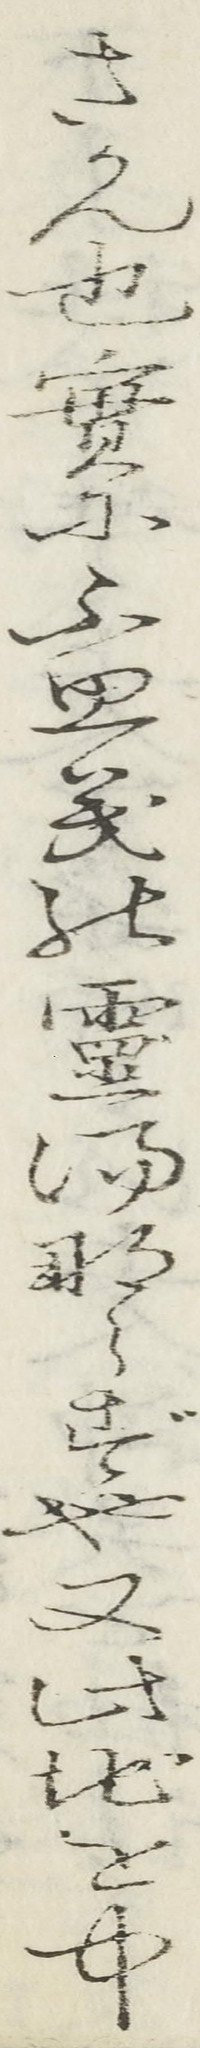さかん也実に不思義の霊湯ならずや又此地を中
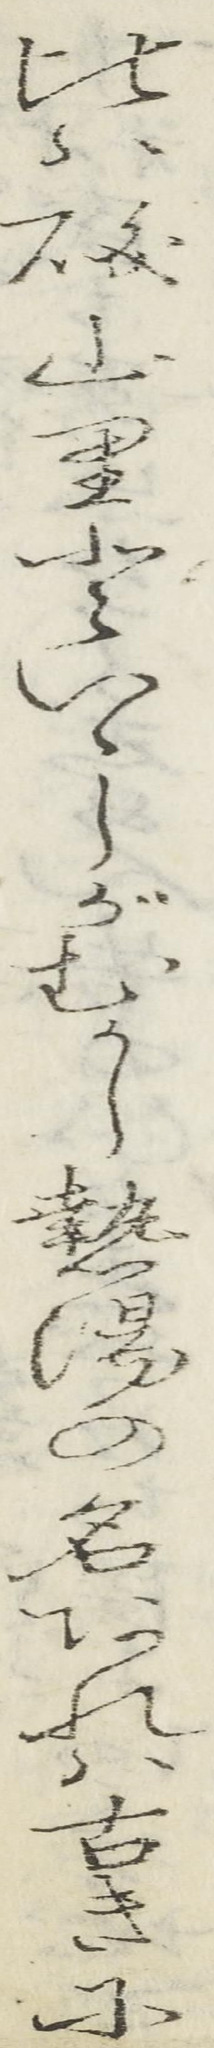比は磯山里といゝしがむかし熱湯の名あれは古きに
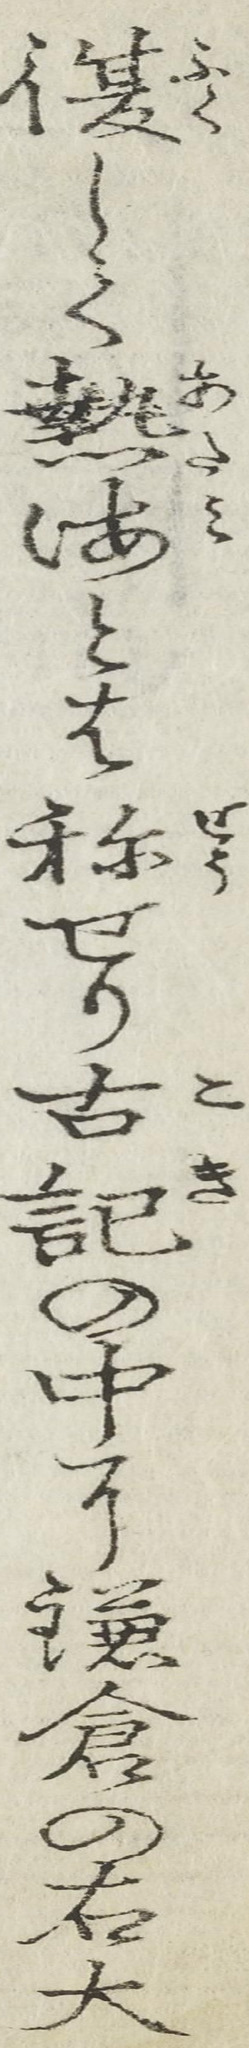復して熱海とは称せり古記の中に鎌倉の右大
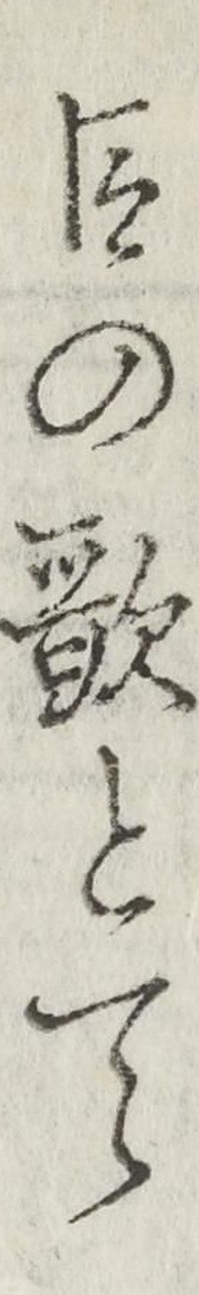臣の歌とて
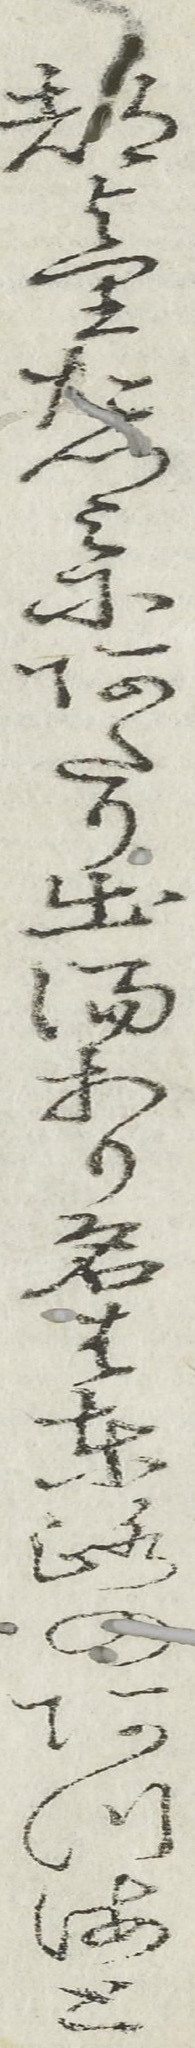都よりたつみにあたり出湯あり名も東路のあつ海と
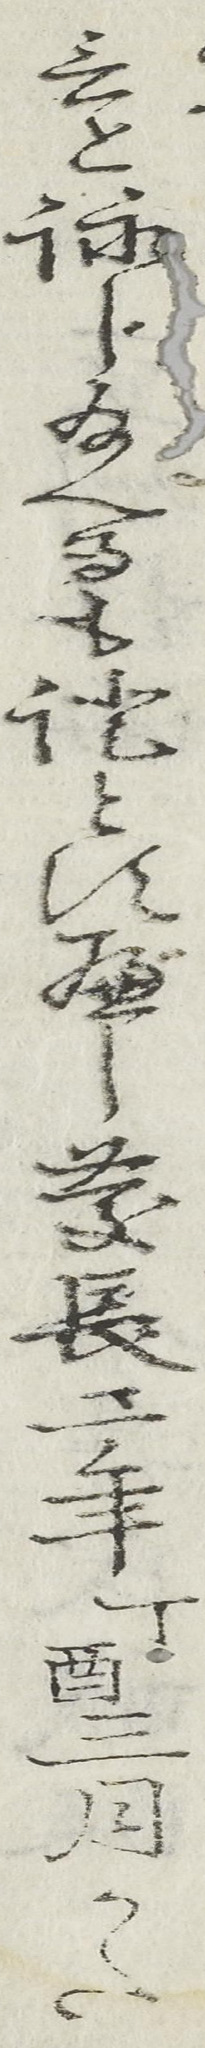言と詠じ給へるも証とすべし慶長二年丁酉三月かた
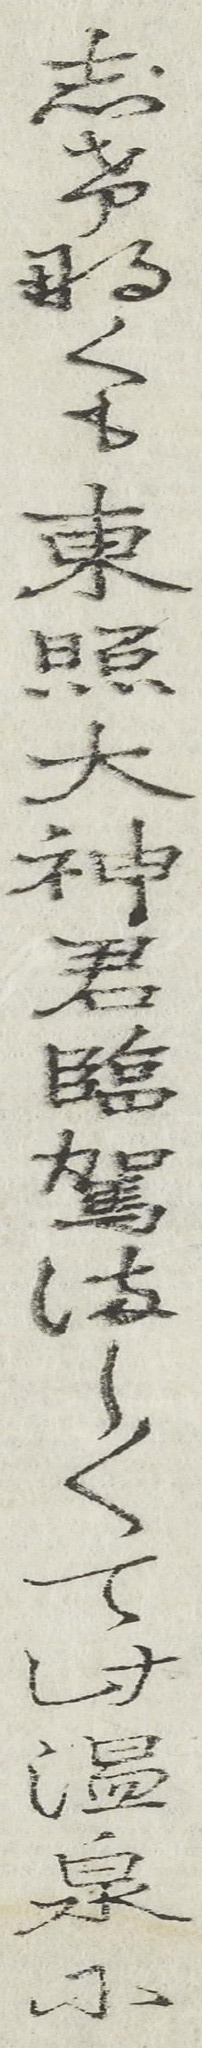しけなくも東照大神君臨駕まし〳〵て此温泉に
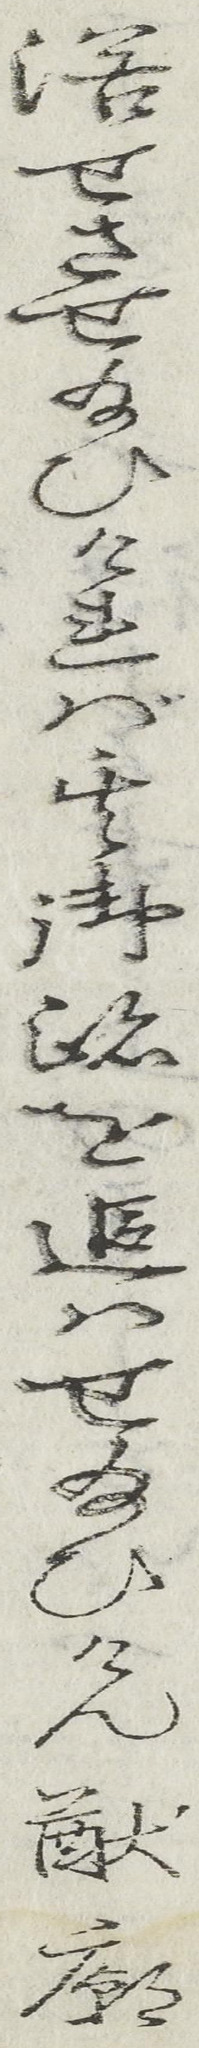浴せさせ給ひければ其御跡を追はせ給ひけん猷廟
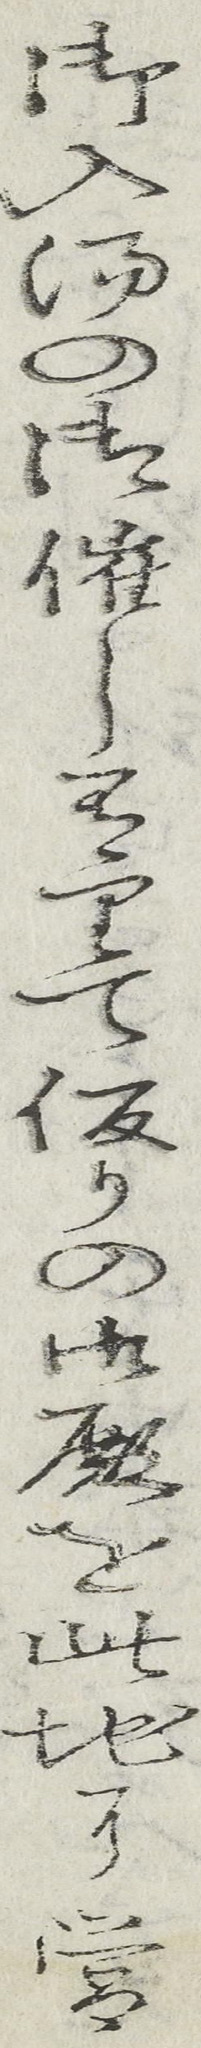御入湯の御催し有りて仮りの御殿を此地に営
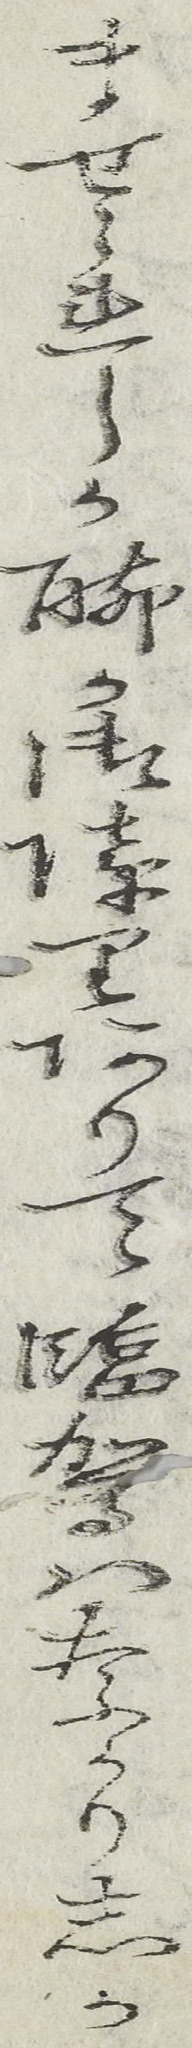ませられしか聊か御障りありて臨駕はなかりしか
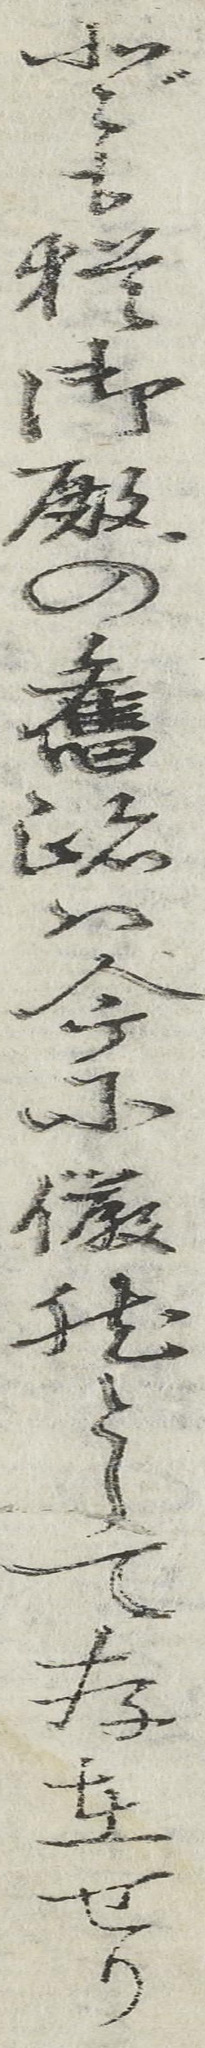ども猶御殿の旧跡は今に儼然として存在せり

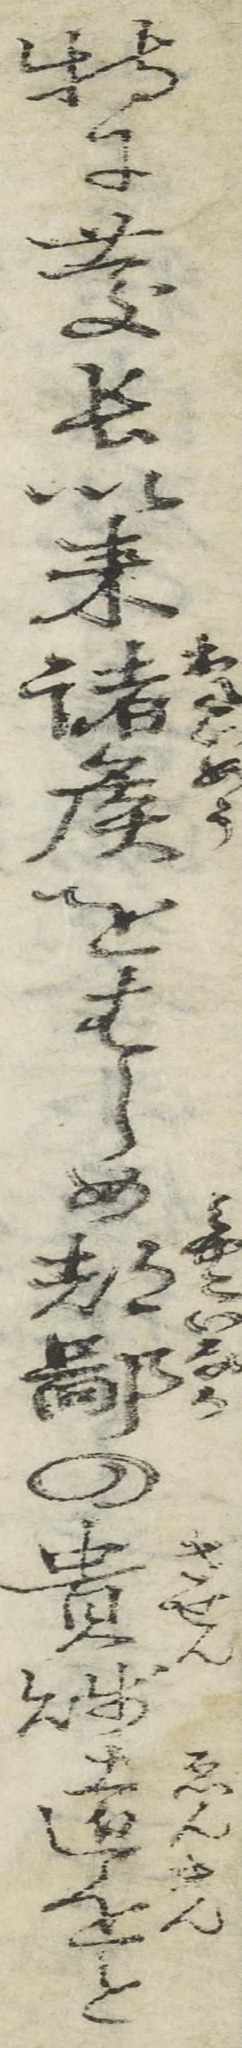特に慶長以来諸矦をはしめ都鄙の貴賤遠近と
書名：豆州熱海温泉由来記
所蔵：東京大学地震研究所図書室 Earthquake Research Institute Library, The University of Tokyo, JAPAN
